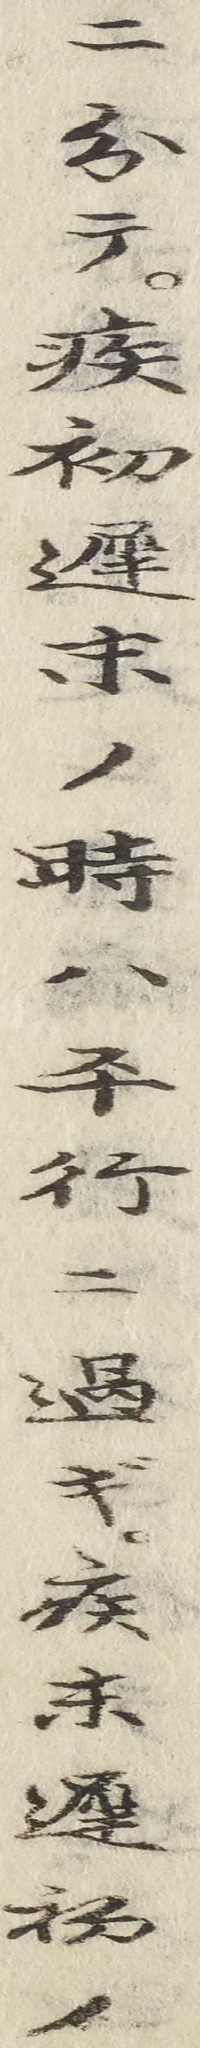ニ分テ。疾初遅末ノ時ｈ平行ニ過ギ。疾末遅初ノ
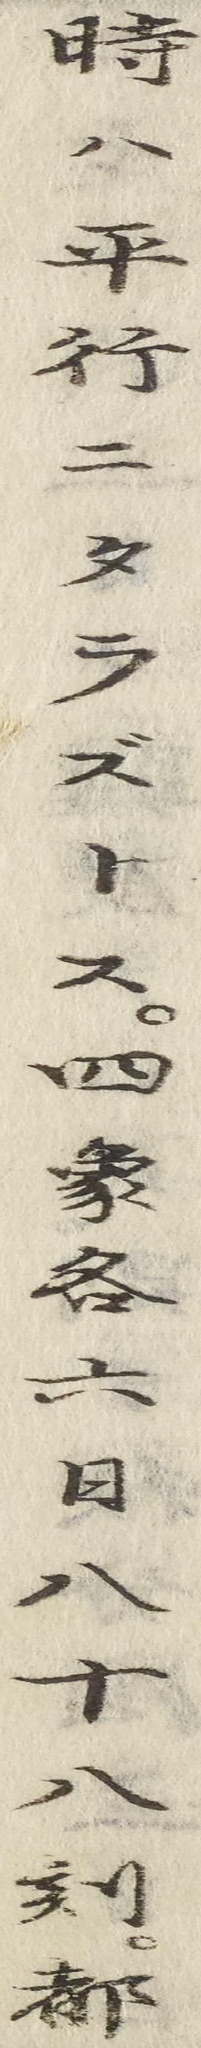時ハ平行ニタラズトス。四象各六日八十八刻。都
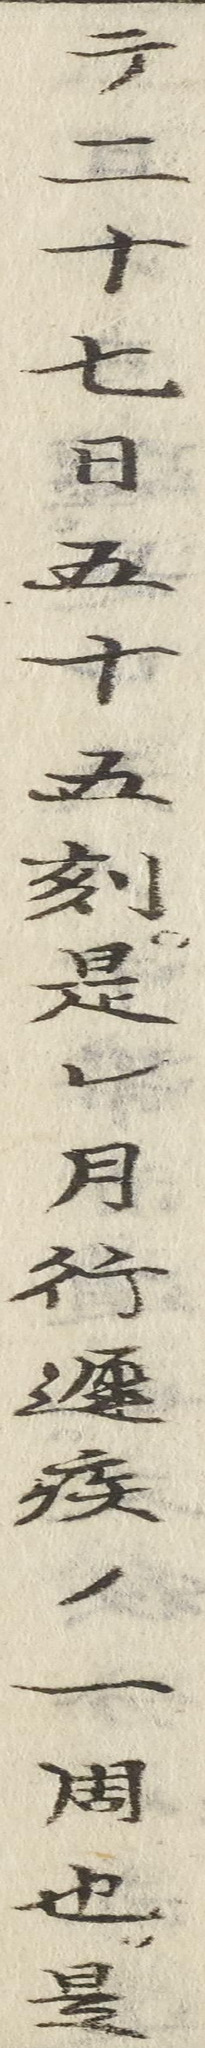テ二十七日五十五刻。是レ月行遅疾一周也。是
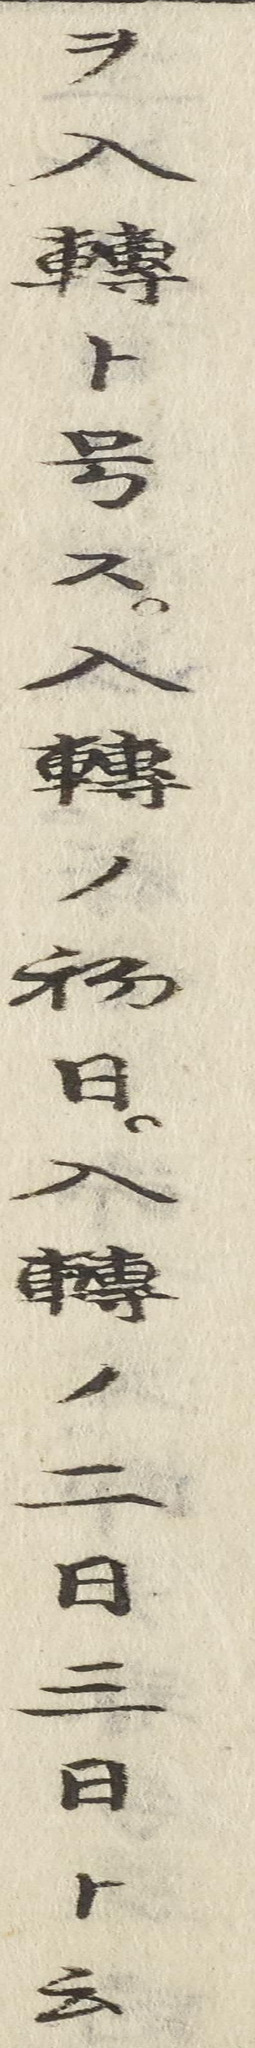ヲ入転ト号ス。入転ノ初日。入転ノ二日三日ト云
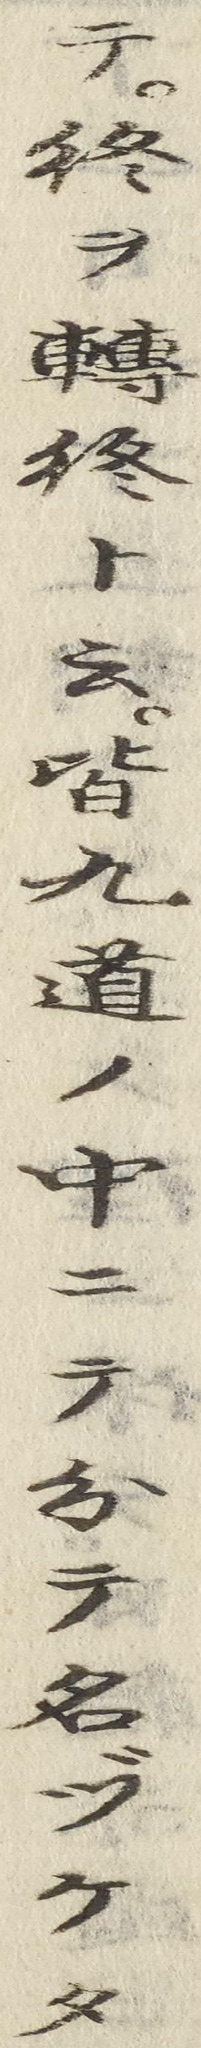テ。終ヲ転終ト云。皆九道ノ中ニテ分テ名ヅケタ
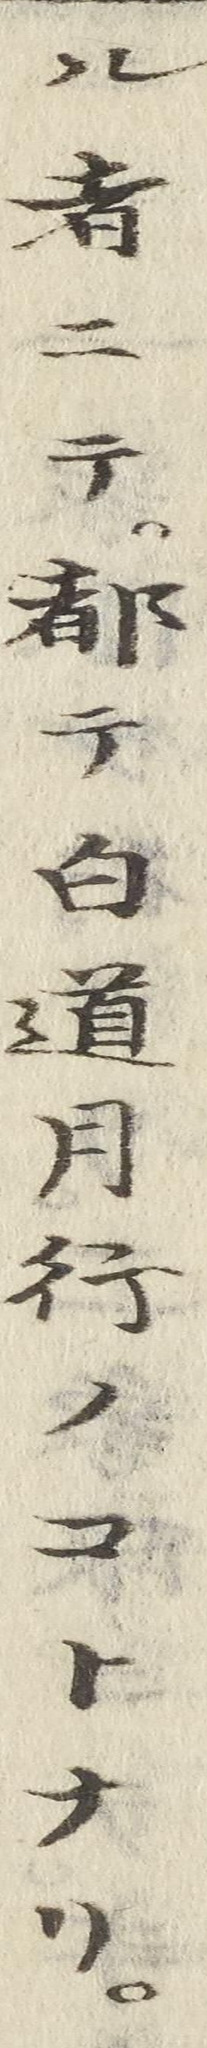ル者ニテ。都テ白道月行ノコトナリ。
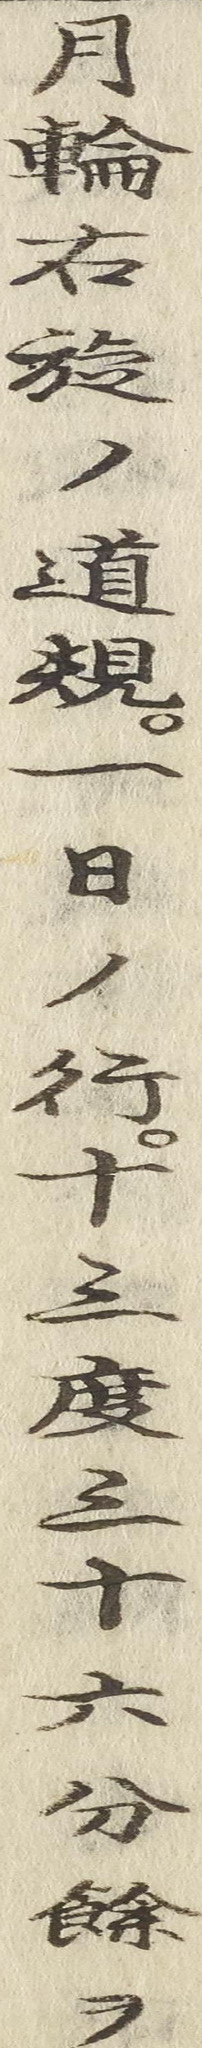月輪右旋ノ道規。一日ノ行。十三度三十六度余ヲ
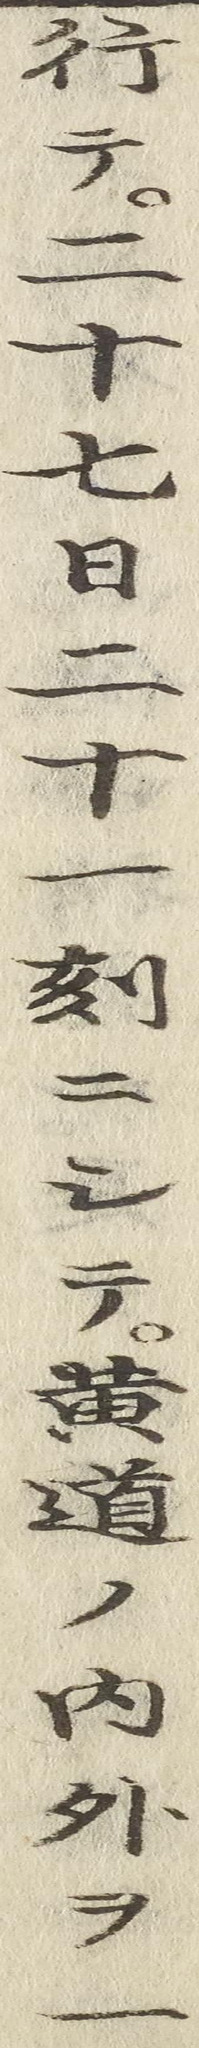行テ。二十七日二十一刻ニシテ。黄道ノ内外ヲ一
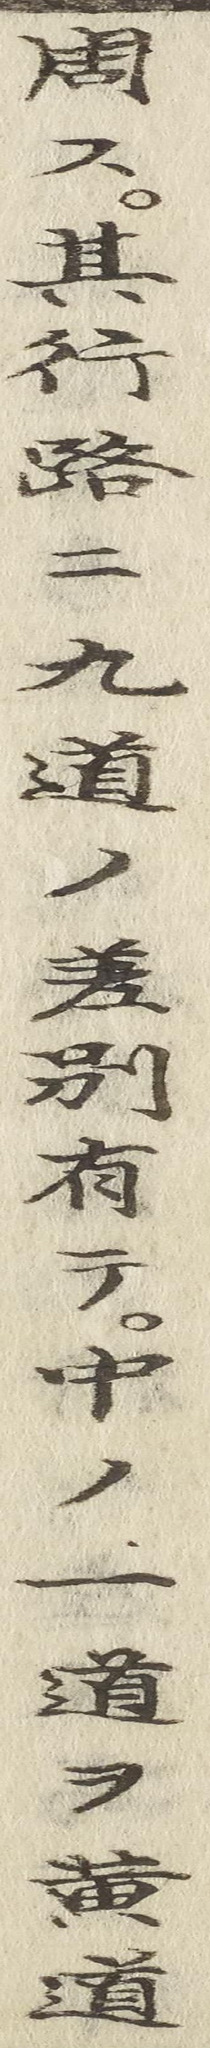周ス。其行路ニ九道ノ差別有テ。中ノ一道ヲ黄道
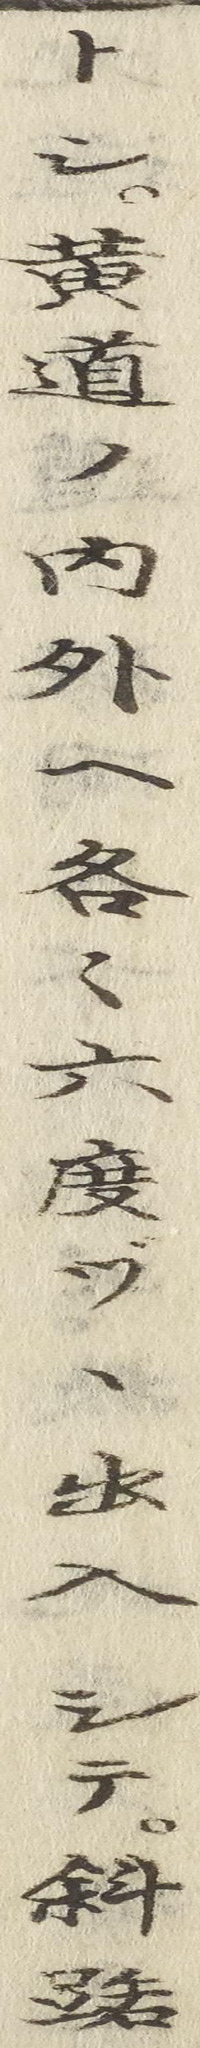トシ。黄道ノ内外ヘ各々六度ヅヽ出入シテ。斜路？
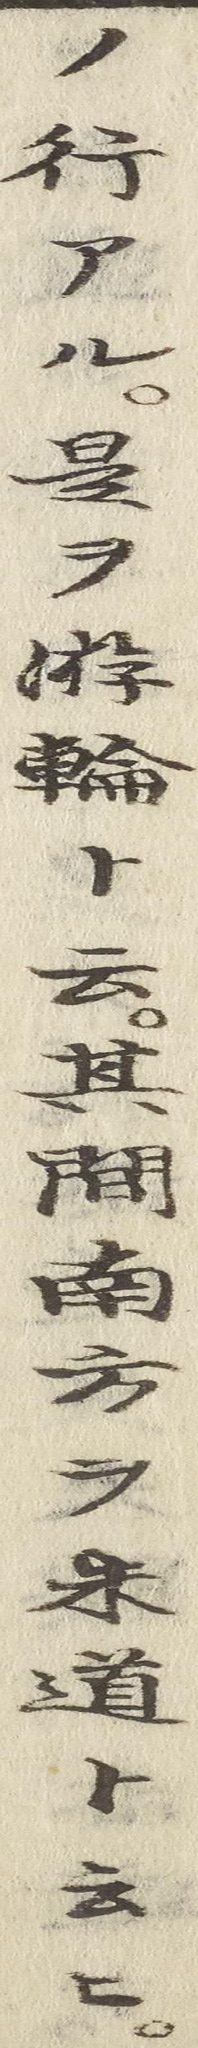ノ行アル。是ヲ游輪ト云。其間南方ヲ朱道ト言云ヒ。
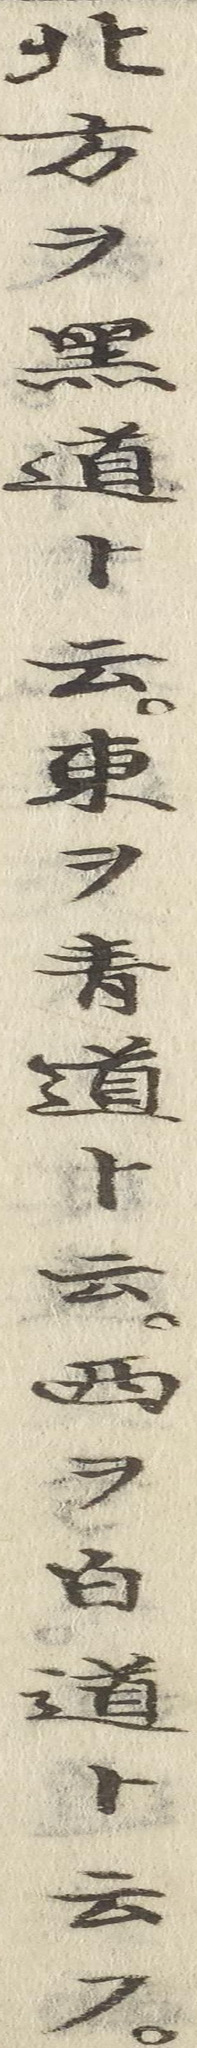北方ヲ黒道ト云。東ヲ青道ト云。西ヲ白道ト云フ。
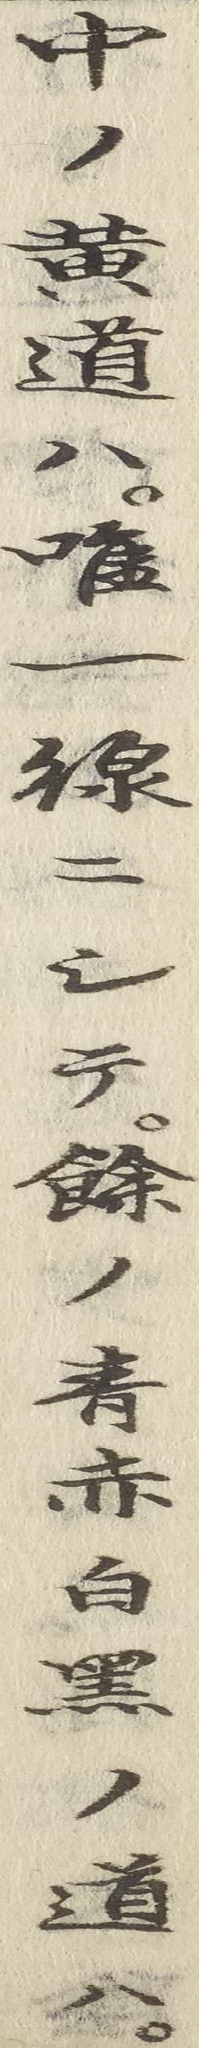中ノ黄道ハ。唯一線ニシテ。余ノ青赤白黒ノ道ハ。
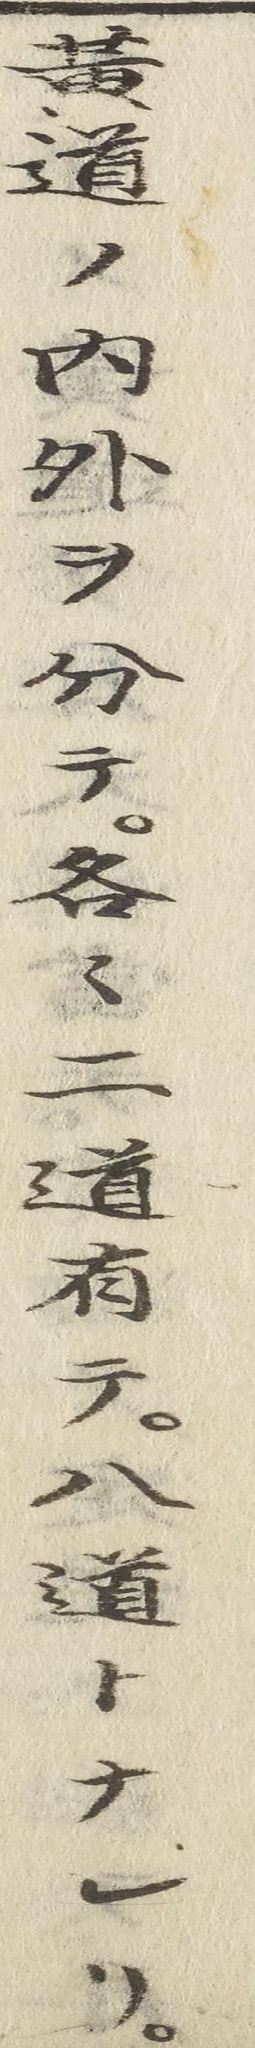黄道ノ内外ヲ分テ。各々二道有テ。八道トナレリ。
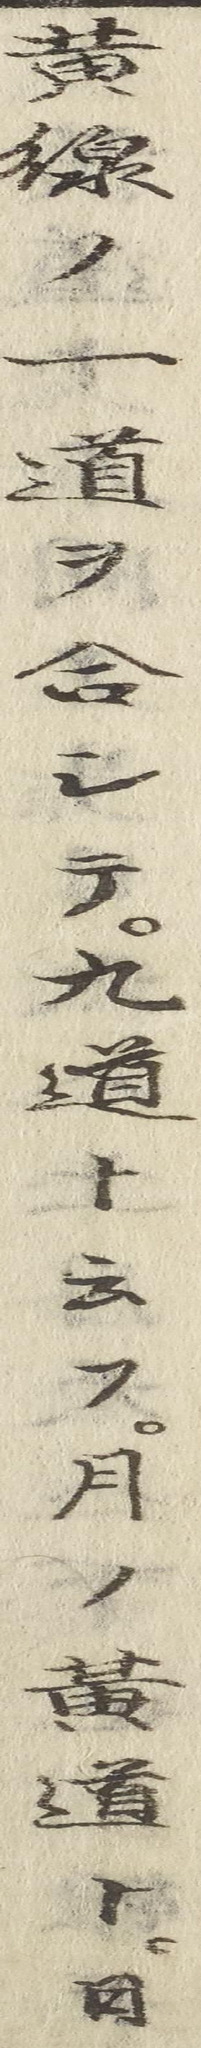黄線ノ一道ヲ合シテ。九道ト云フ。月ノ黄道ト。日

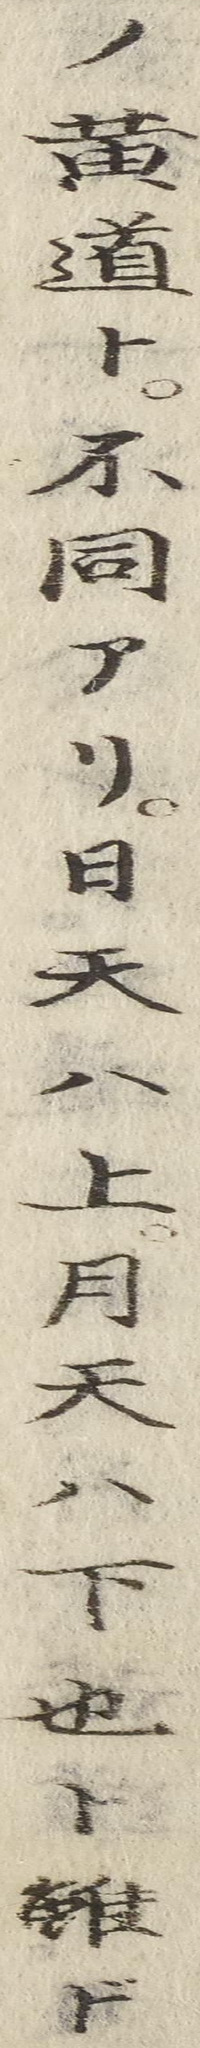ノ黄道ト。不同アリ。日天ハ上。月天ハ下也ト雖ド
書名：大略天学名目鈔　天經或問附録
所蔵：東京大学地震研究所図書室 Earthquake Research Institute Library, The University of Tokyo, JAPAN
